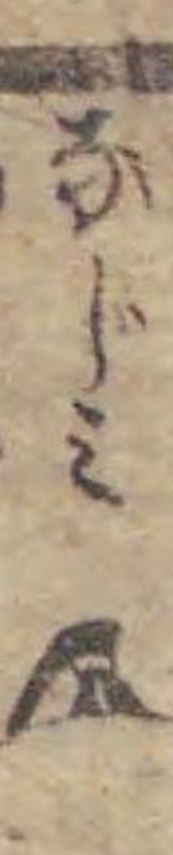なじみ
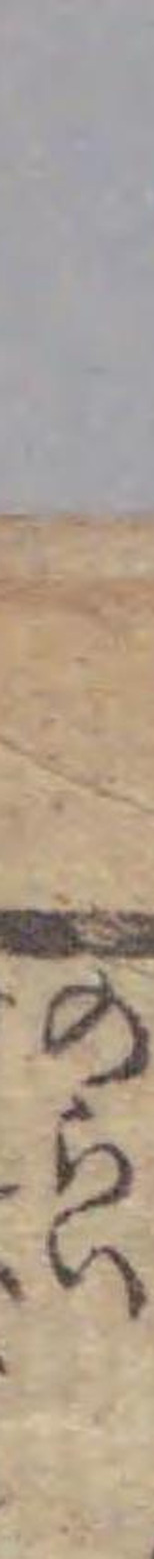のらい
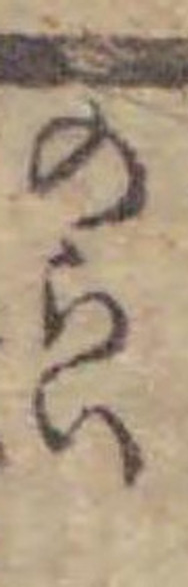のらい
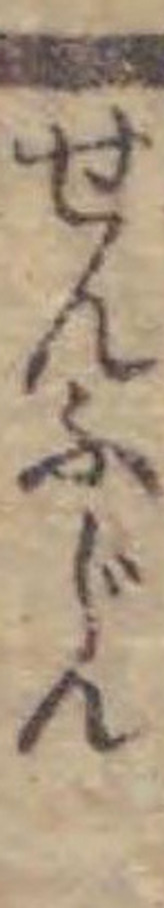せんふじん
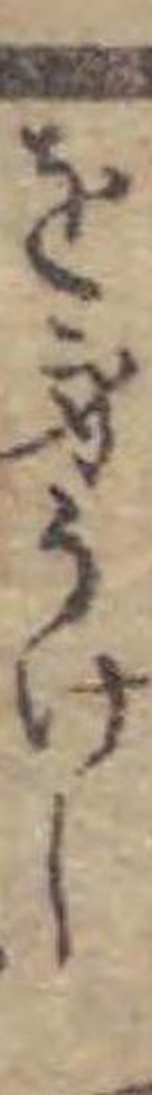を身うけし
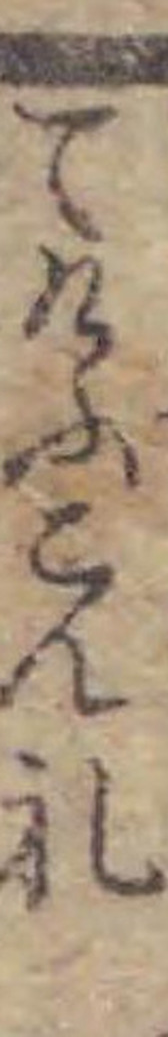てけふこんれ
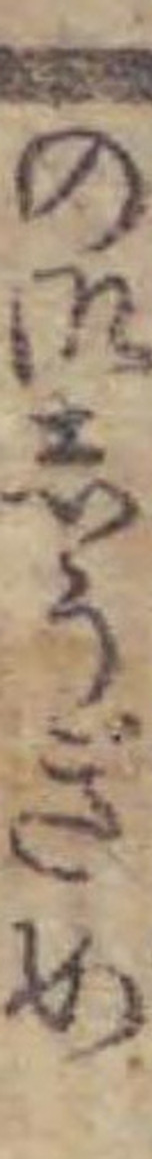の御しうぎめ
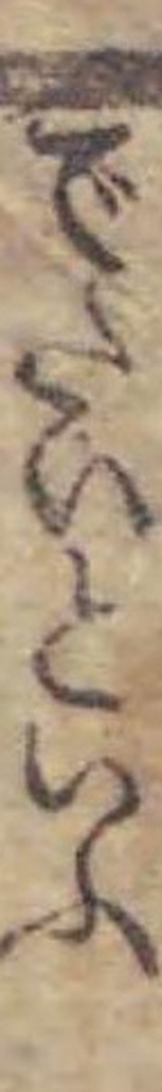でたいといふ
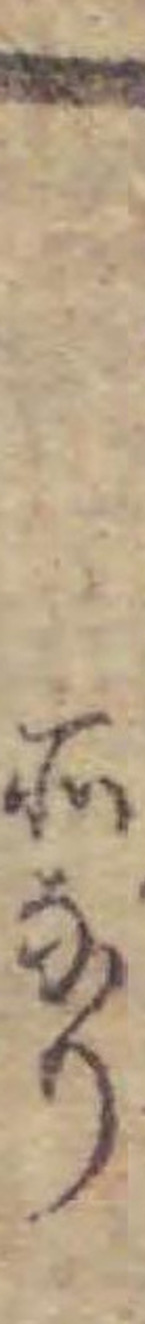所なり
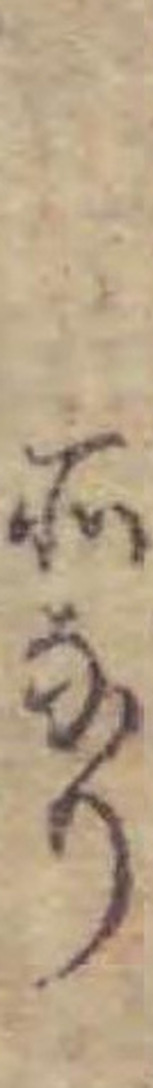所なり
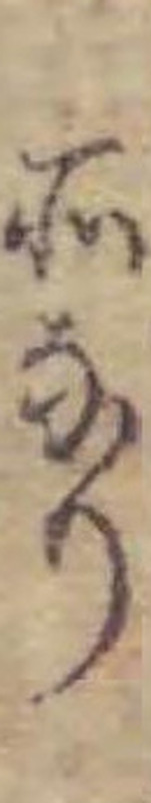所なり
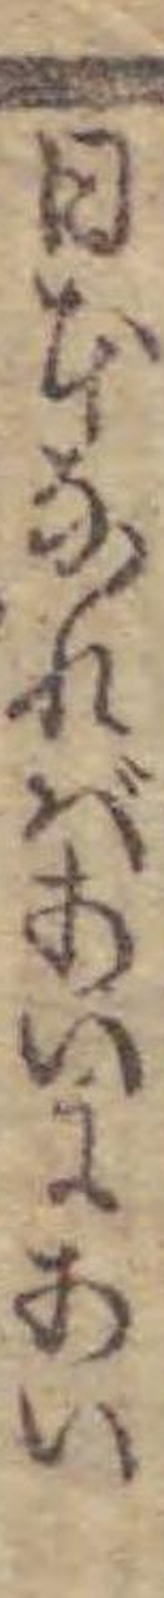日本なればあいにあい
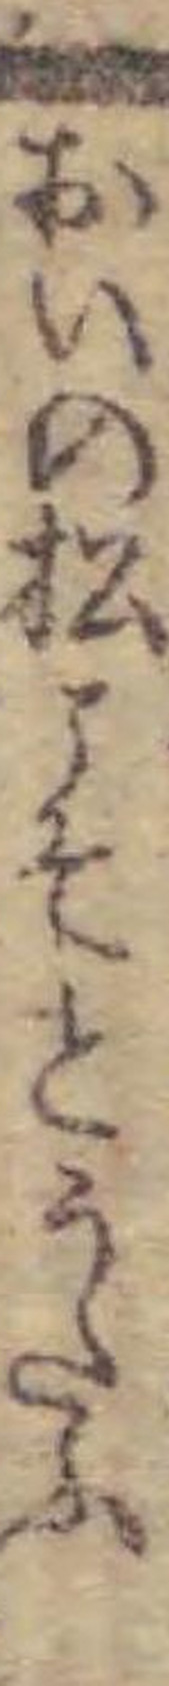おいの松こそとうたふ
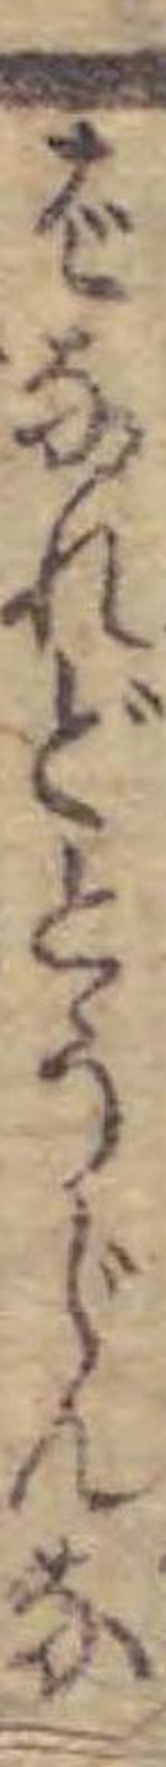ばなれどとうじんな
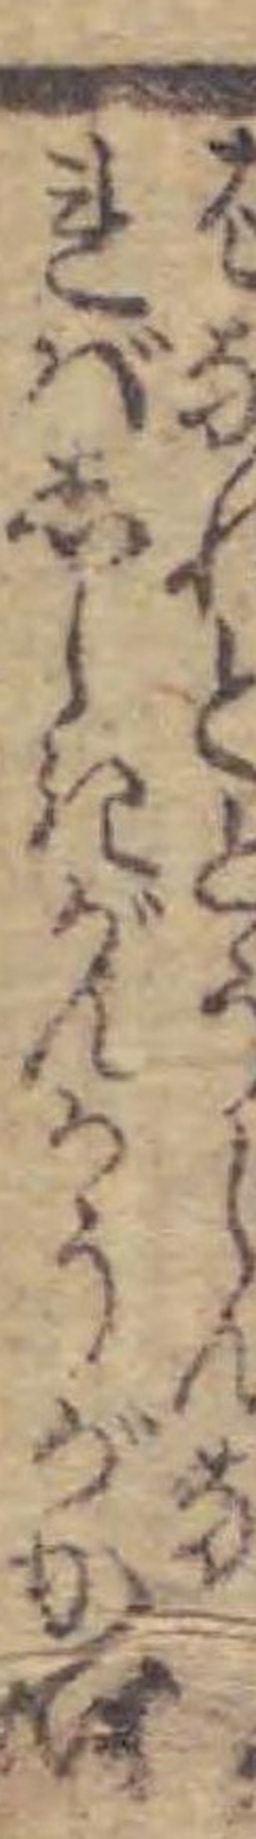ればししきがんかうがかい
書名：此奴和日本 : 2巻
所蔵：国立国会図書館 National Diet Library, JAPAN
